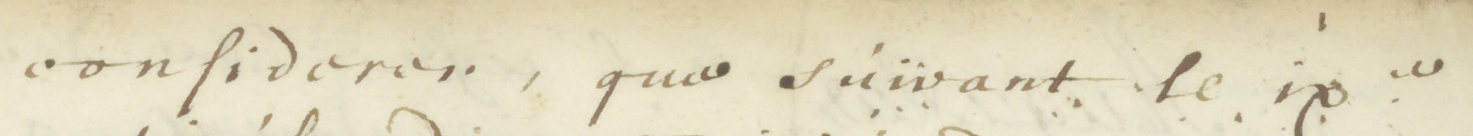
considerer, que suivant le ixe.
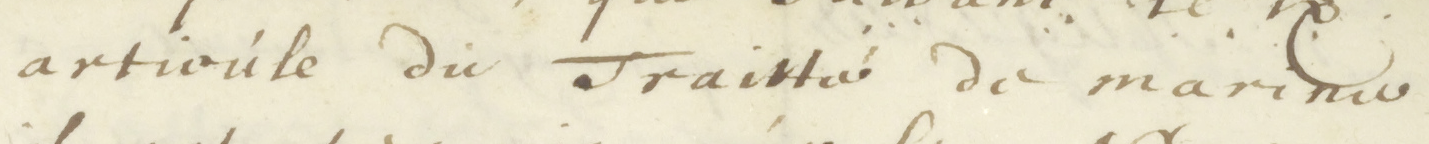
articule du Traitté de marine
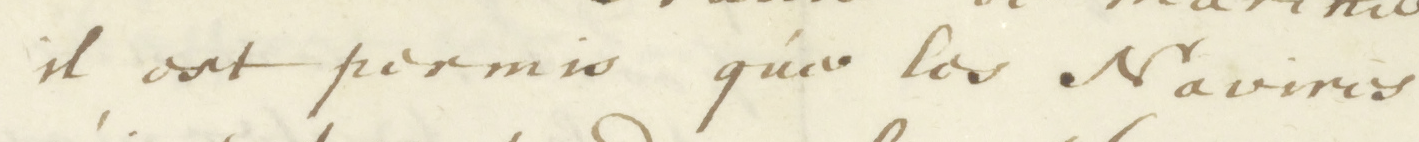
il est permis que les Navires
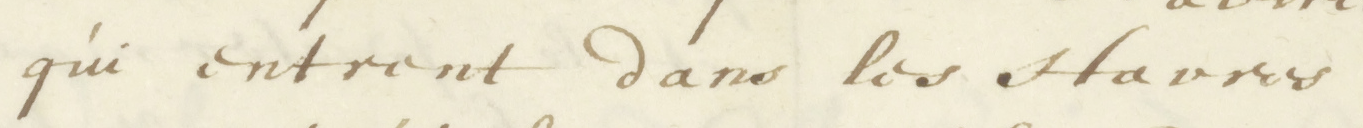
qui entrent dans les Havres
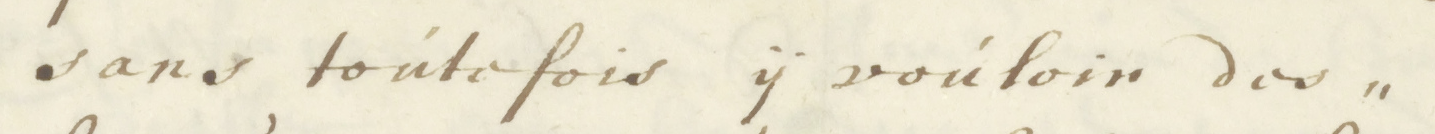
sans toutefois ij vouloir des„
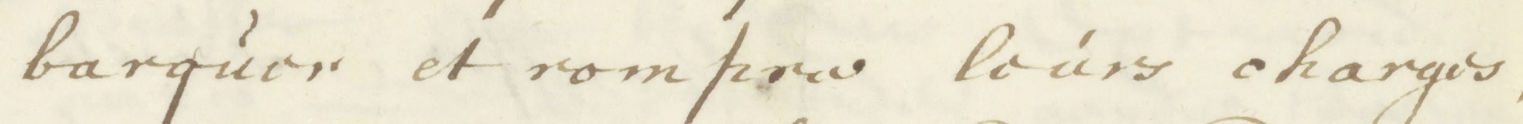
barquer et rompre leurs charges,
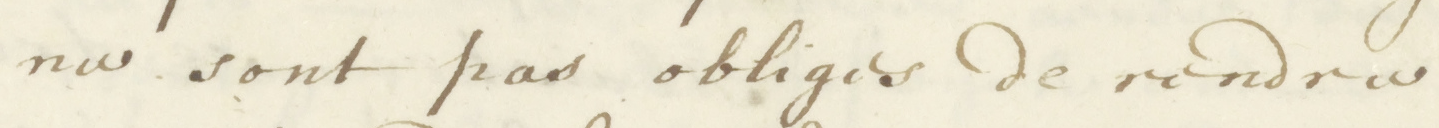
ne sont pas obliges de rendre
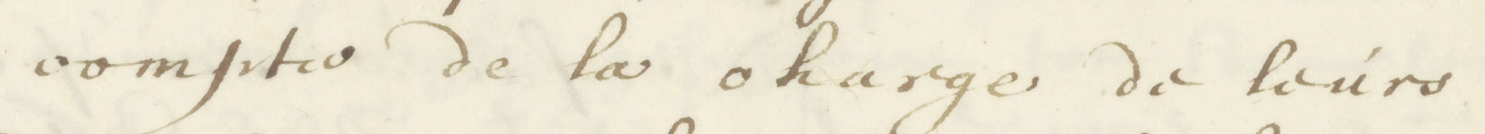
compte de la charge de leurs
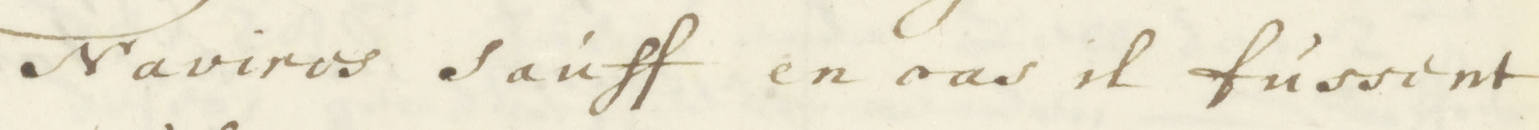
Navires sauff en cas il fussent
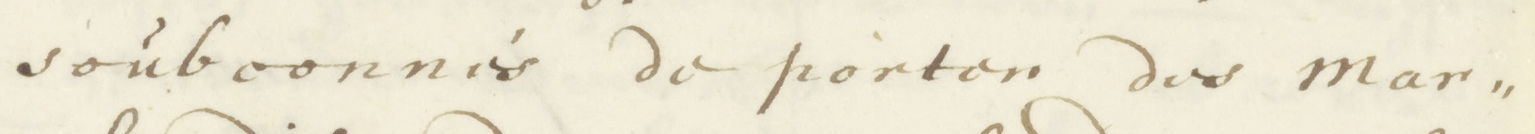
soubconnés de porter des Mar„
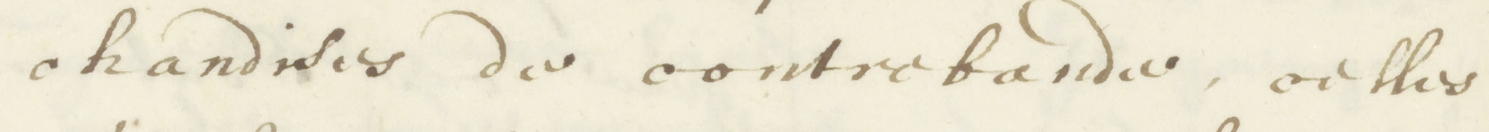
chandises de contrebande, celles
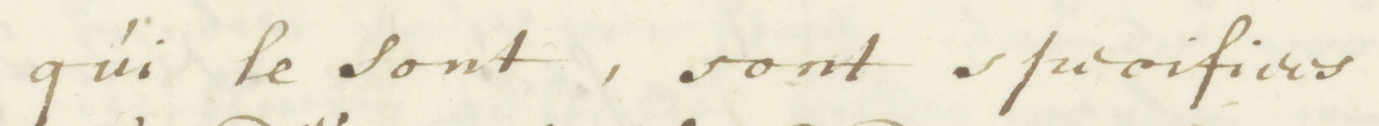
qui le sont, sont specifiees
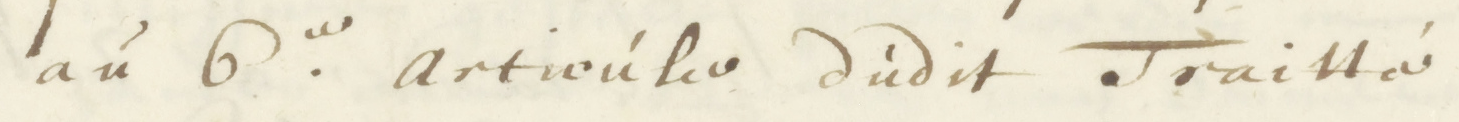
au 6e. Articule dudit Traitté
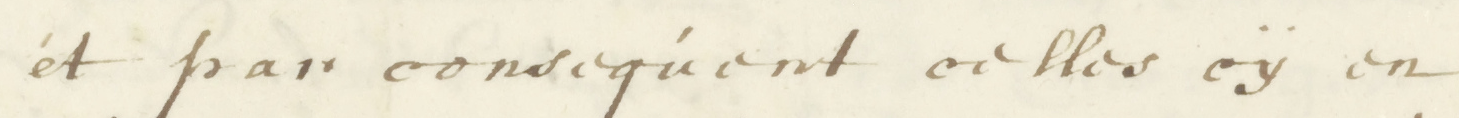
et par consequent celles cy en
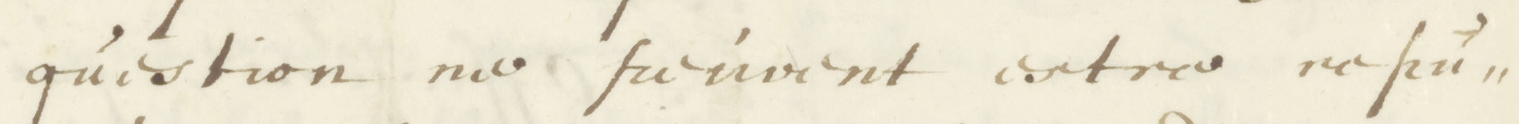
question ne peuvent estre repu„
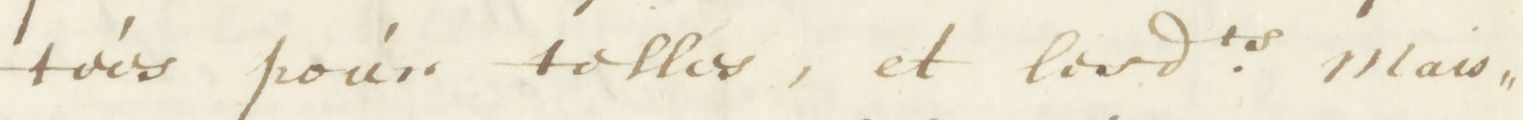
tées pour telles, et lesdts. Mais„
